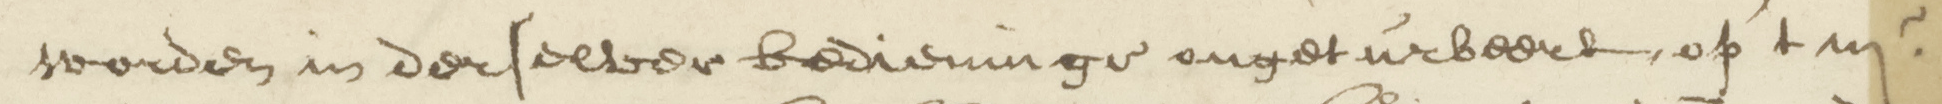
worden in derselver bedieninge ongeturbeert, op 't iiie
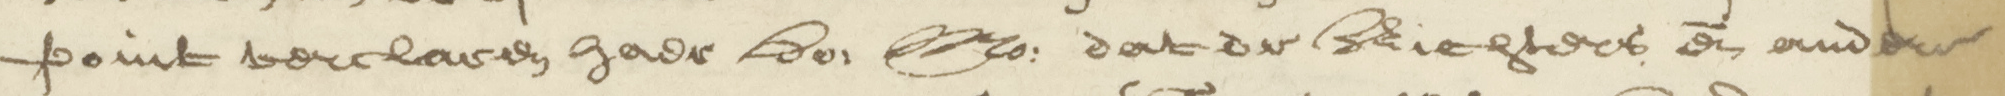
point verclaren haer Ho:Mo: dat de Richters en andere
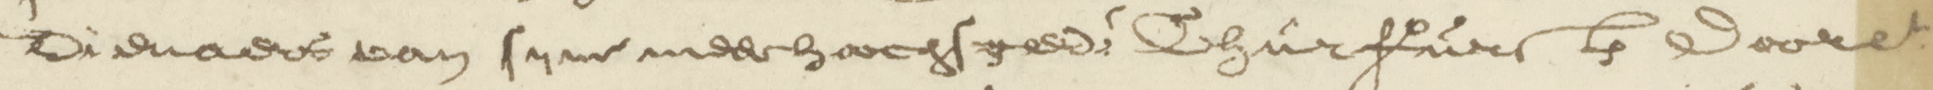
dienaers van syne meerhoochstged Churfurstl Doorlt
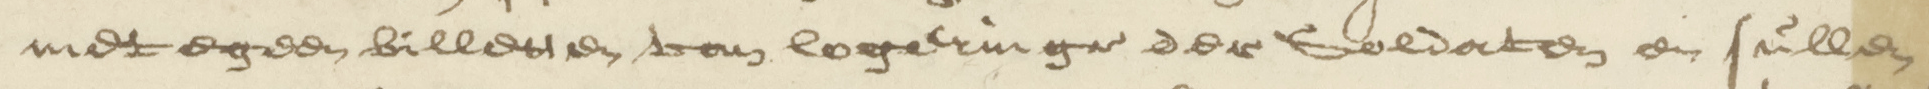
met egeen billetten van logeringe der soldaten en sullen
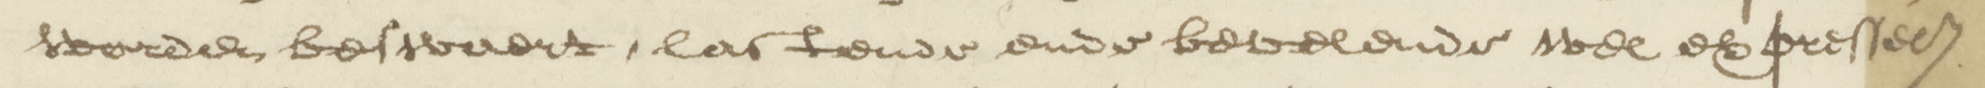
worden beswaert, lastende ende bevelende wel expressel
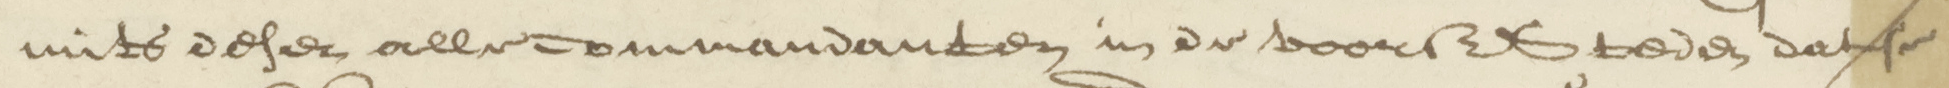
mits desen alle commandanten in de voors Steden dat se
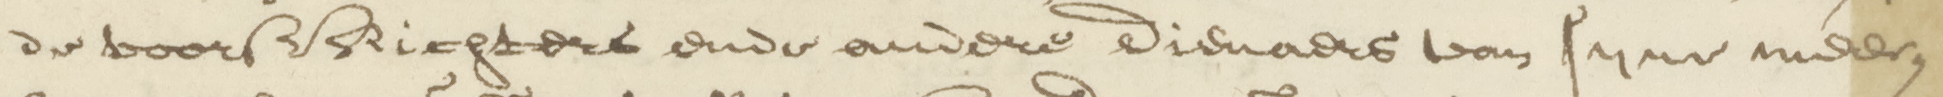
de voors Richters ende andere dienaers van syne meer,,
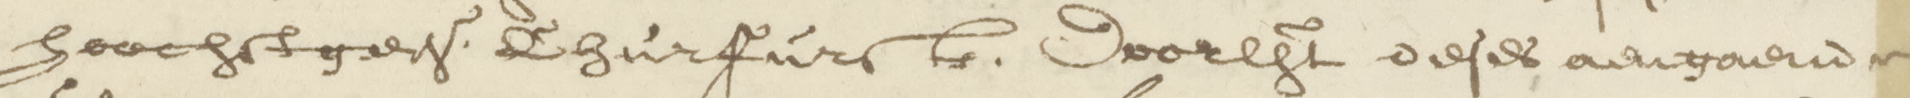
hoochstgede Churfurstl Doorlht deses aengaende
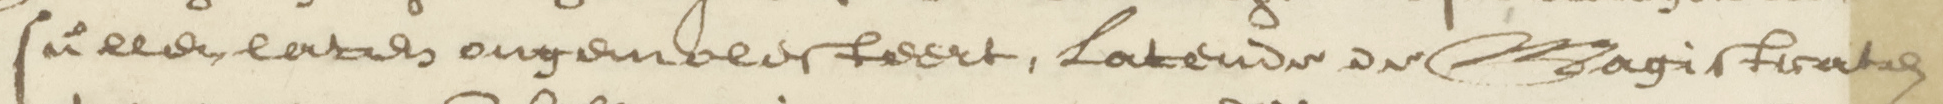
sullen laten ongemolesteert, latende de Magistraten
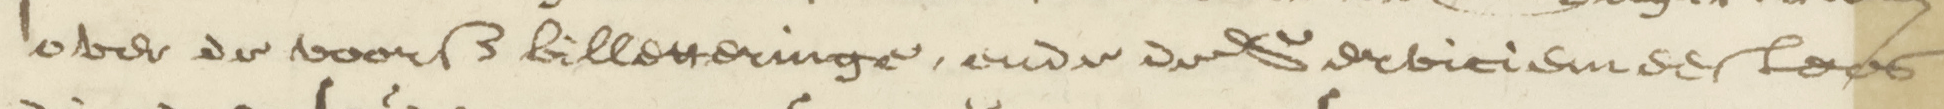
over de voors billetteringe ende de Servicienmeesters
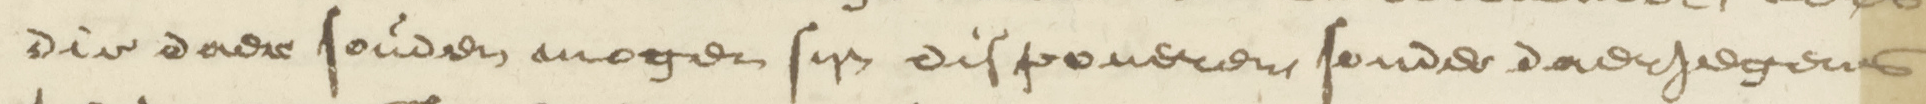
die daer souden mogen syn disponeren sonder daerjegens
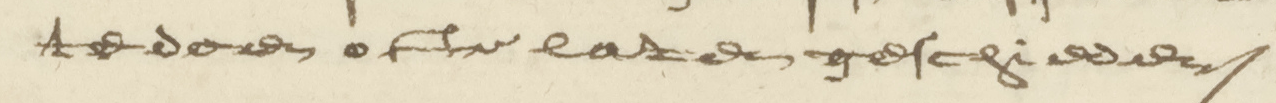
te doen offte laten geschieden.
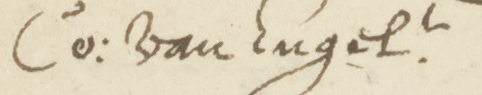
Co. van Engelt
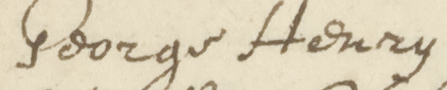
George Henry
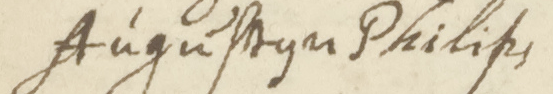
Augustyn Philips
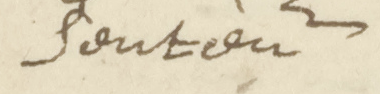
senten
